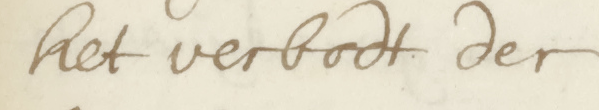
het verbodt der
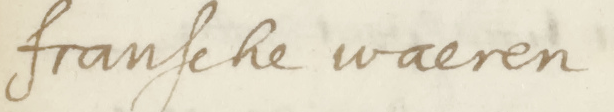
fransche waeren
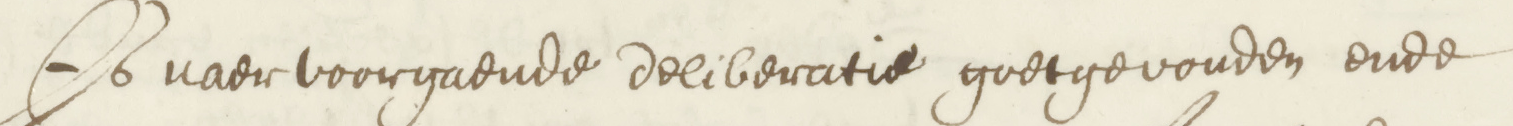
Is naer voorgaende deliberatie goetgevonden ende
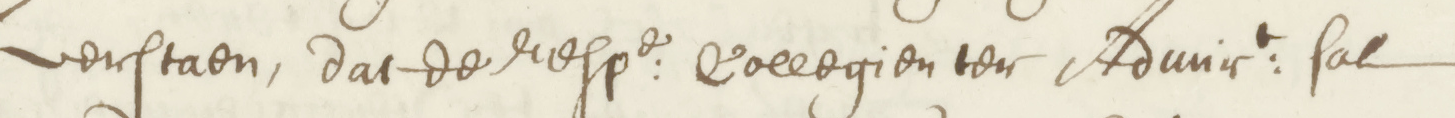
verstaen, dat de respe. Collegien ter Admirt: sal
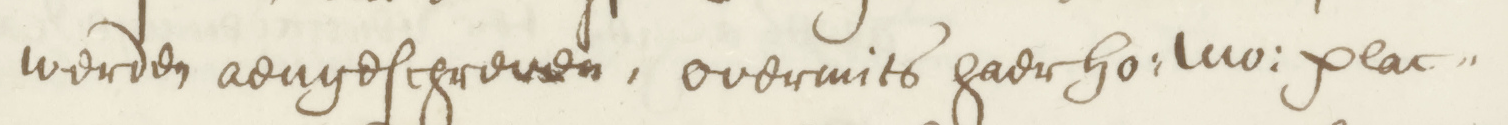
werden aengeschreven, overmits haer ho:Mo: Plac,,
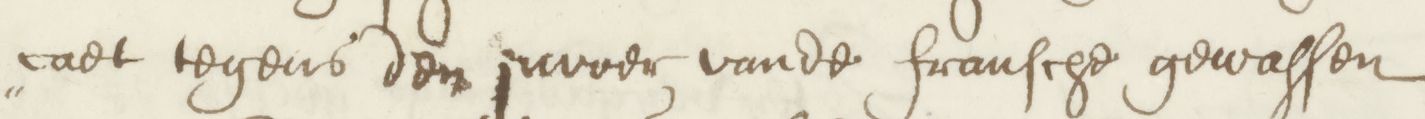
caet tegens den invoer van de fransche gewassen
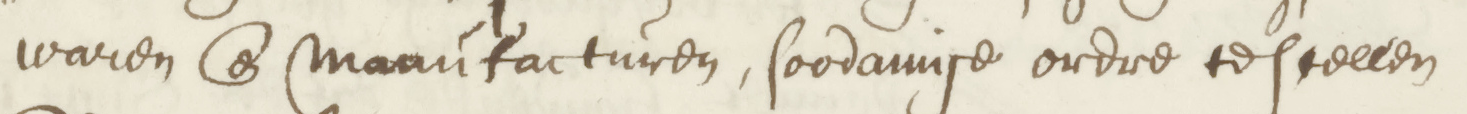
waren & manufacturen, soodanige ordre te stellen
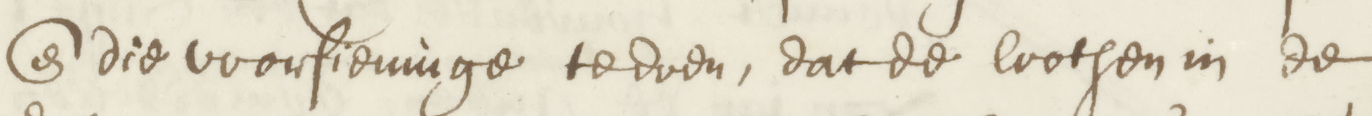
& die voorsieninge te doen, dat de lootsen in de
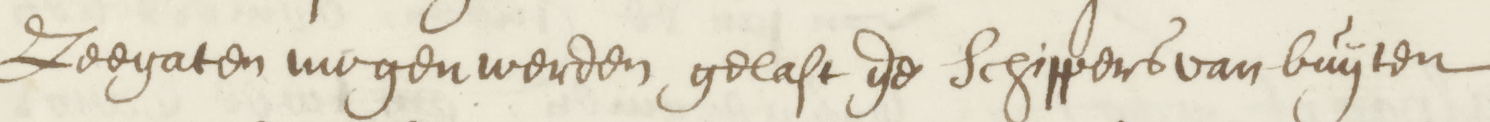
Zeegaten mogen werden gelast de Schippers van buijten
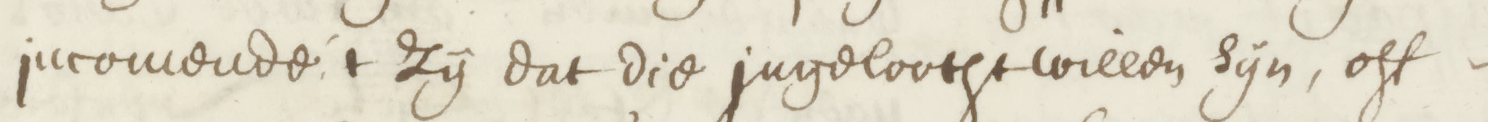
incomende, t zij dat die ingelootst willen sijn, oft
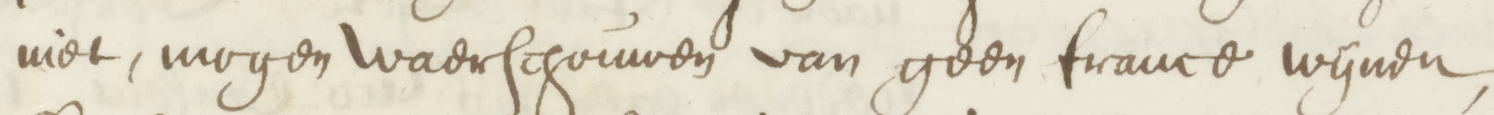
niet, mogen waerschouwen van geen france wijnen,
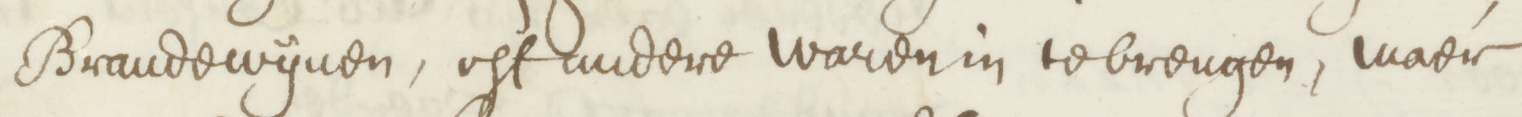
Brandewijnen, off andere waren in te brengen, maer
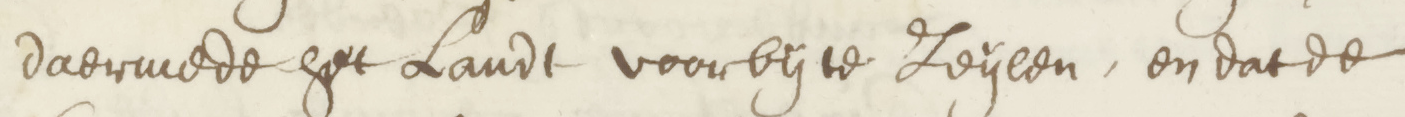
daermede het Landt voorbij te Zeijlen, en dat de
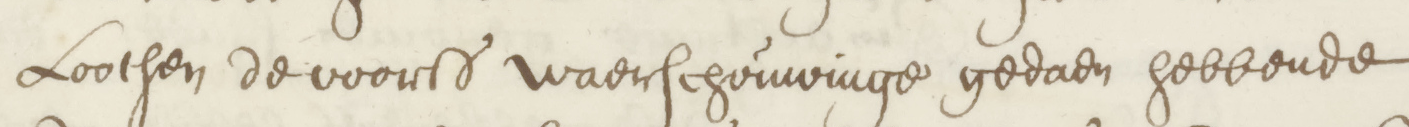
Lootsen de voors waerschouwinge gedaen hebbende
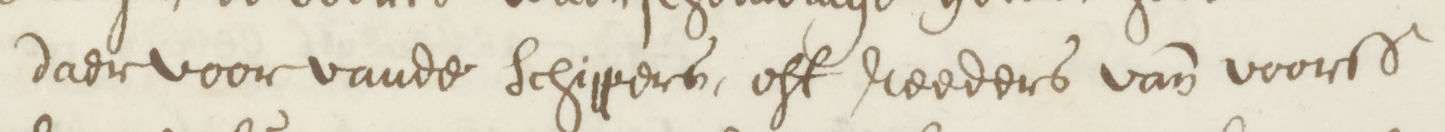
daer voor vande schippers, oft reeders van voors
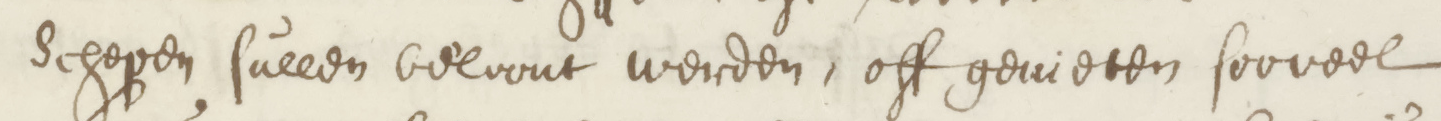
schepen sullen beloont werden, off genieten sooveel
